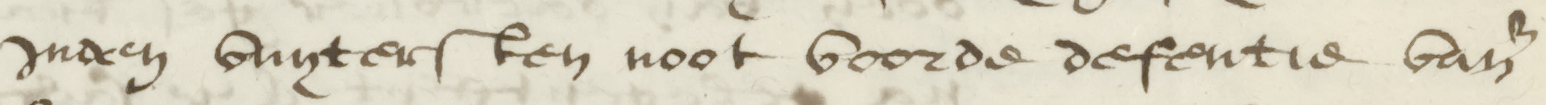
inden vuytersten noot voorde defentie van
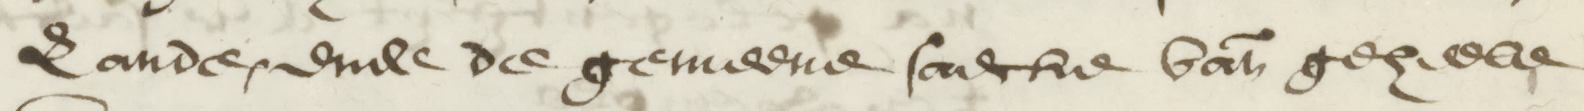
Lande, ende de gemeene saecke van geheele
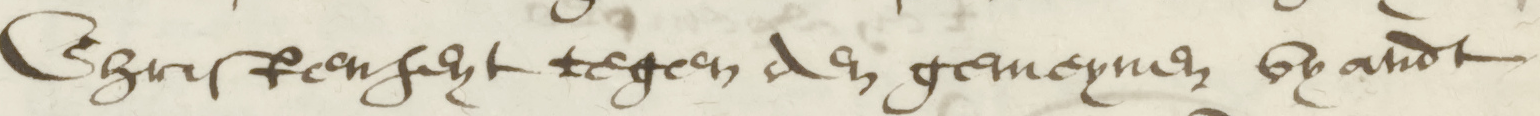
Christenheyt tegen den gemeynen vyandt
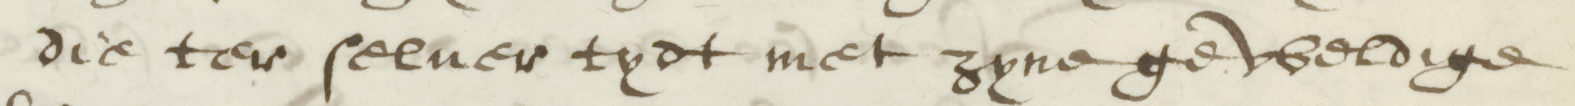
die ter seluer tydt met zyne geweldige
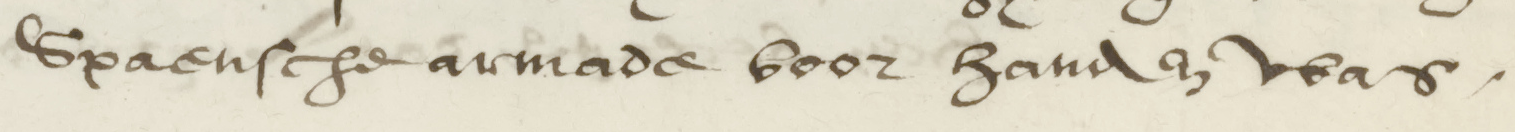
Spaensche armade voor handen was.
